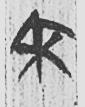宋
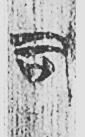司
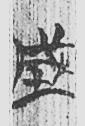城
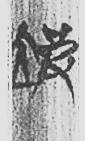{立皮}
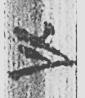之
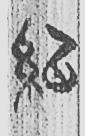約
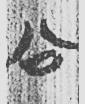公
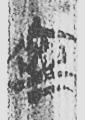室
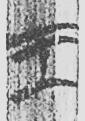王
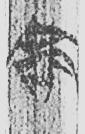命
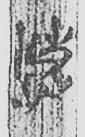莫
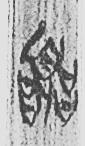囂
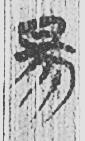昜
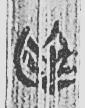爲
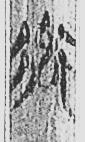率
